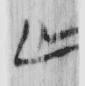亡
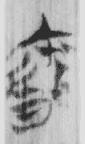{尒䎽}
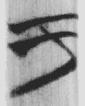于
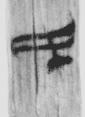民
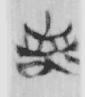若
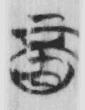否
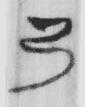乃
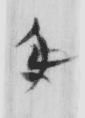身
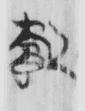{才食卩}
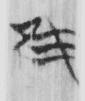隹
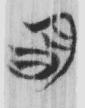明
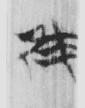隹
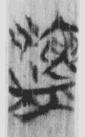{演皿}
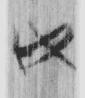女
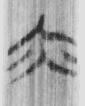亦
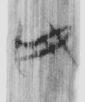母
